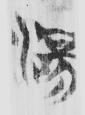湯
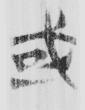或
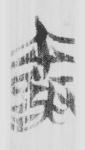{尒䎽}
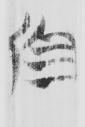於
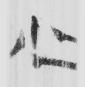少
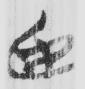臣
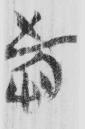㤅
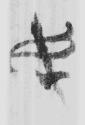民
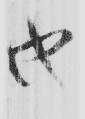女
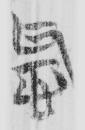怠
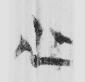少
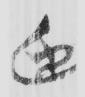臣
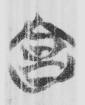合
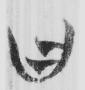曰
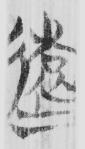遠
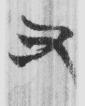又
